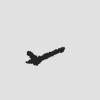月
